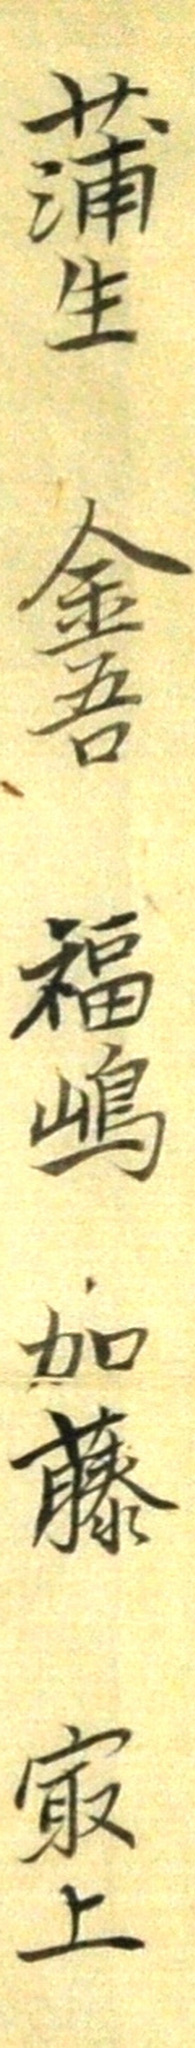蒲生金吾福嶋加藤最上
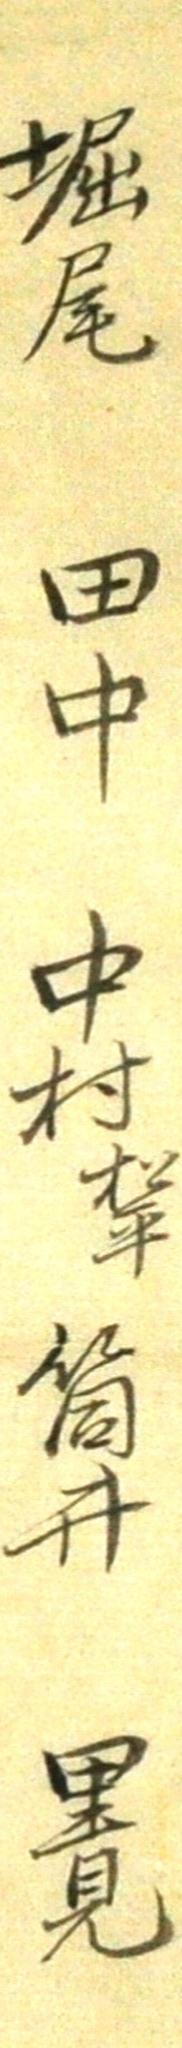堀尾田中中村松平筒井里見
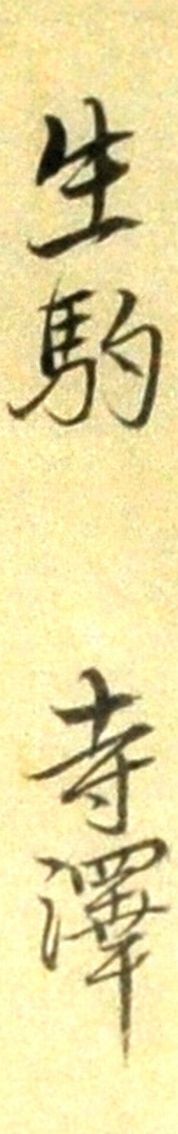生駒寺沢
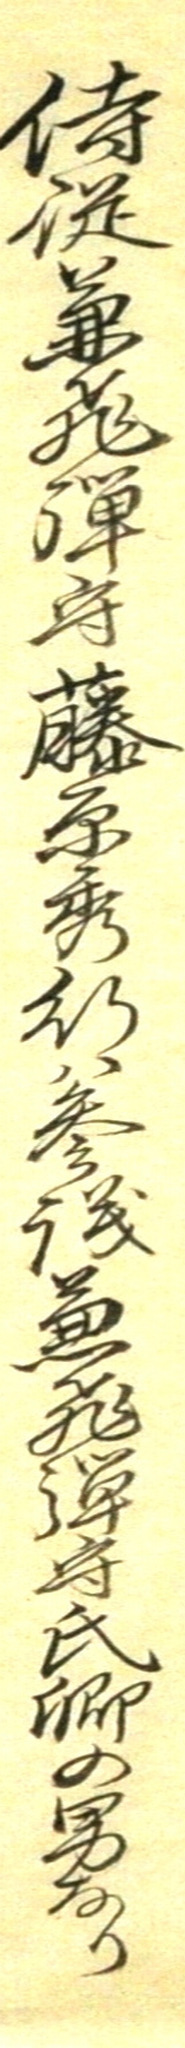侍従兼飛騨守藤原秀行ハ参議兼飛騨守氏郷のお男なり
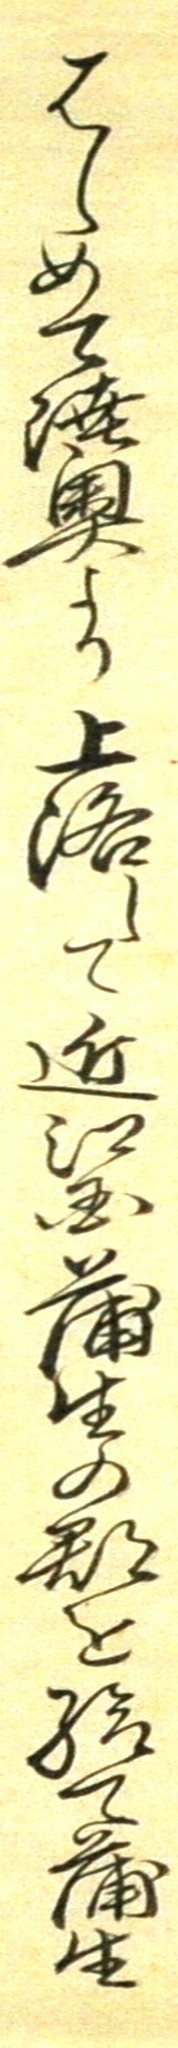はしめて陸奥より上洛して近江国蒲生の郡を給て蒲生
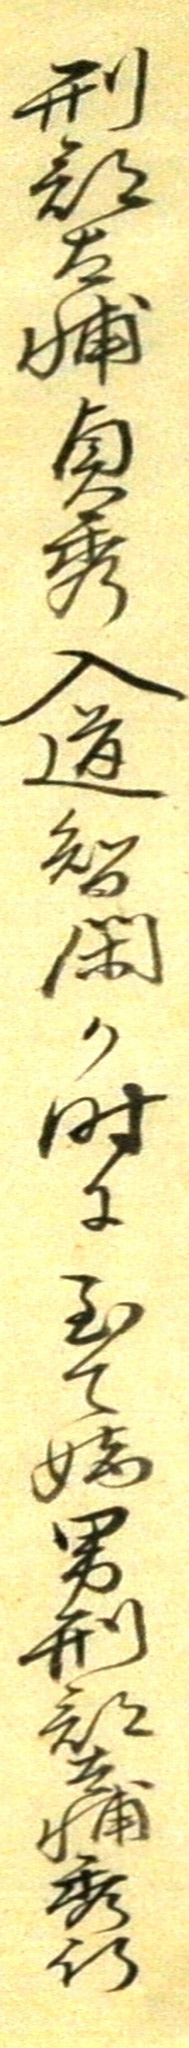刑部太輔貞秀入道智閑か時に至て嫡男刑部太輔秀行
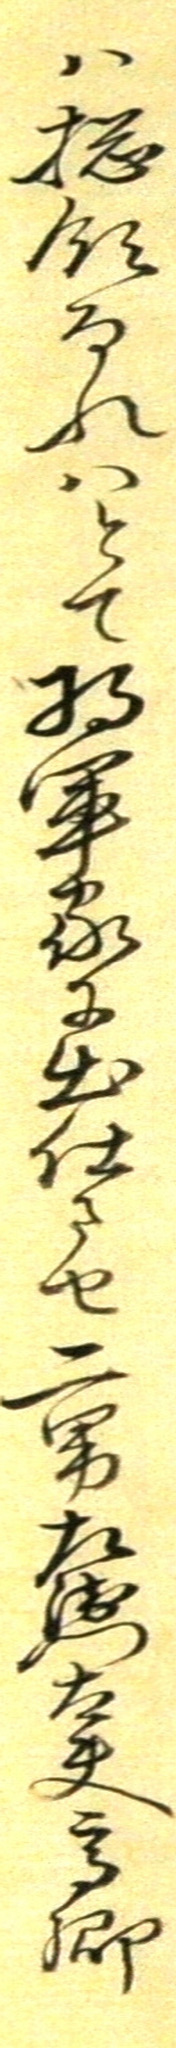は捴領なれはとて将軍家に出仕させ二男左衛門太夫高郷

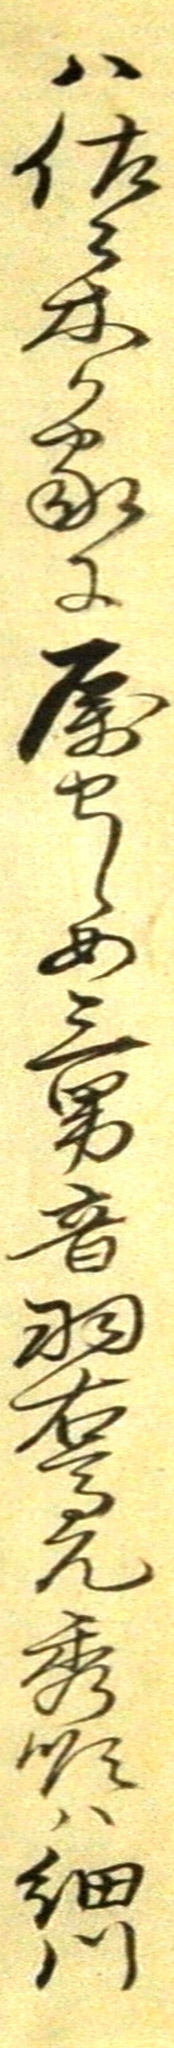は佐々木家に属せしめ三男音羽右馬允碑で秀順は細川
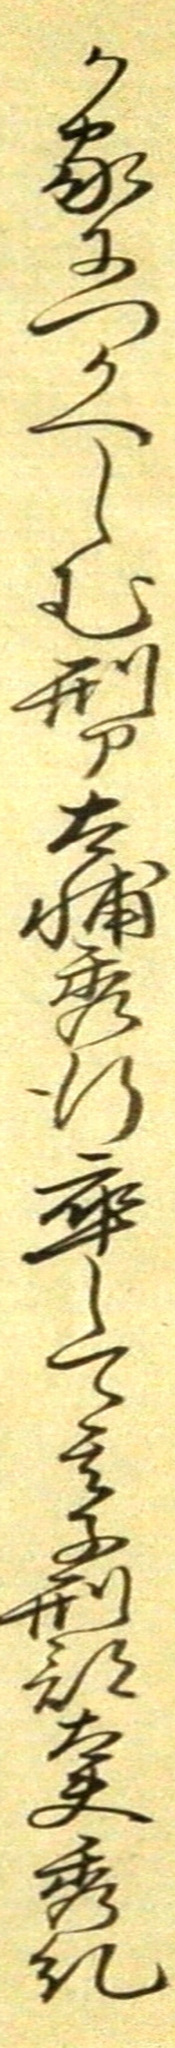か家につかへしむ刑部太輔秀行卒して其子刑部太夫秀糺
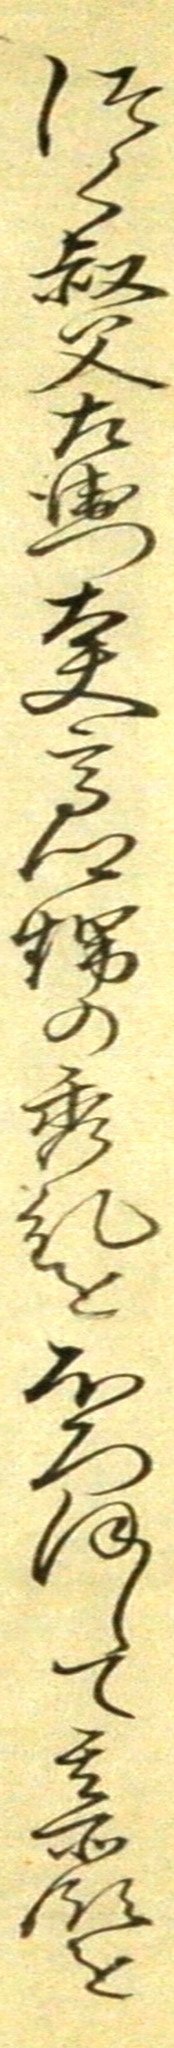つく叔父左衛門太夫高郷甥の秀糺をほろほして其所領を
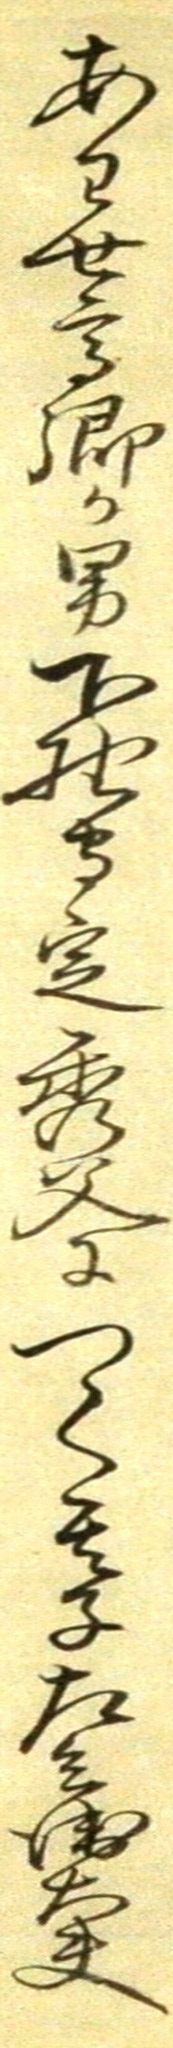あわせ高郷か男下野守定秀父につく其子左兵衛太夫
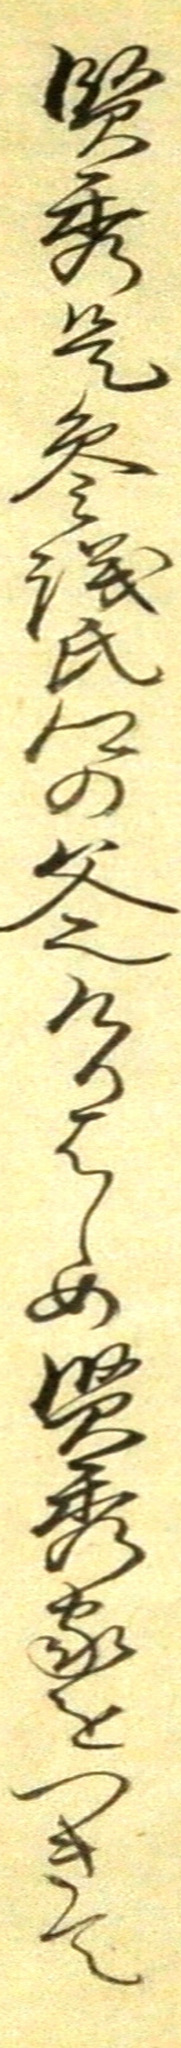賢秀是参議氏郷の父也けりはしめ賢秀家をつきて
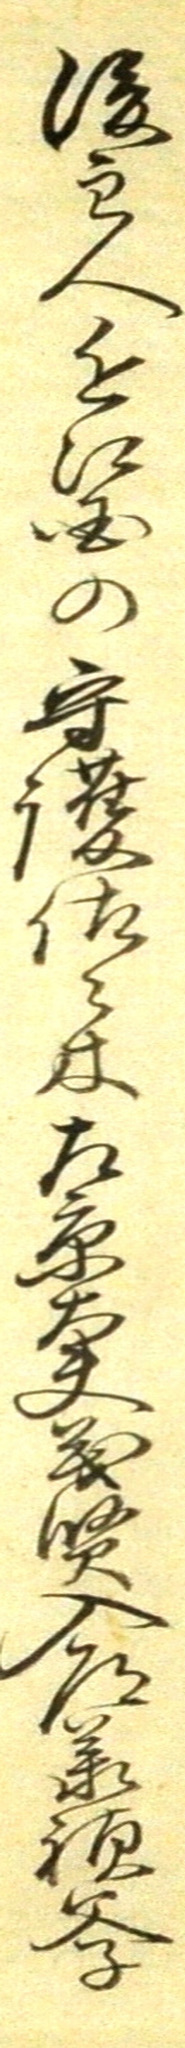後主人近江国の守護佐々木左京太夫義賢入道承禎父子
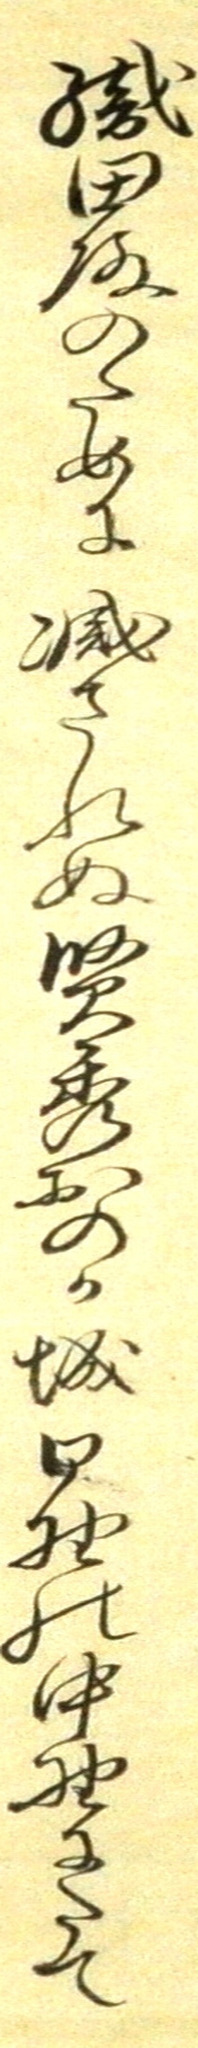織田殿のために滅されぬ賢秀おのか城日野の中野にたて
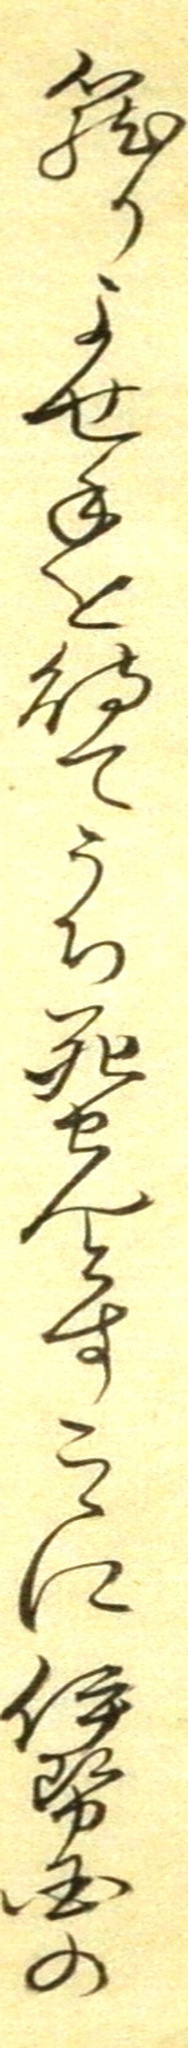籠りよせ手を待てうち死せんとすこヽに伊勢国の
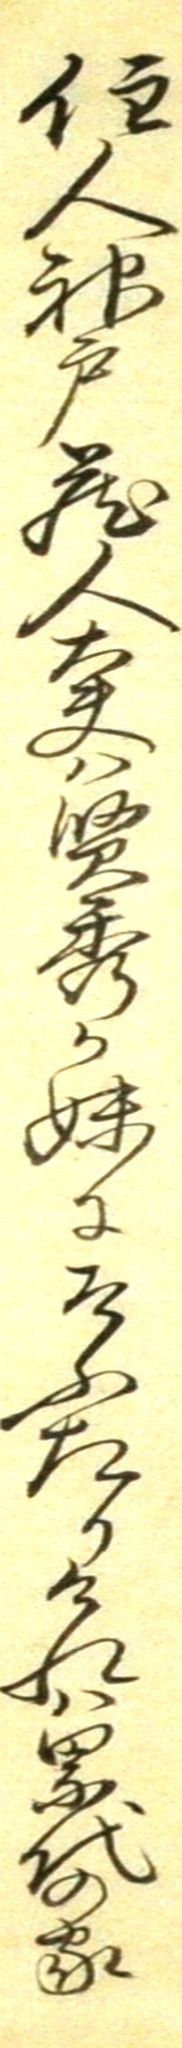住人神戸蔵人大夫は賢秀か妹にそふたりけれは累代の家
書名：藩翰譜（十二・上）
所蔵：伊那市立高遠町図書館・合同会社AMANE
